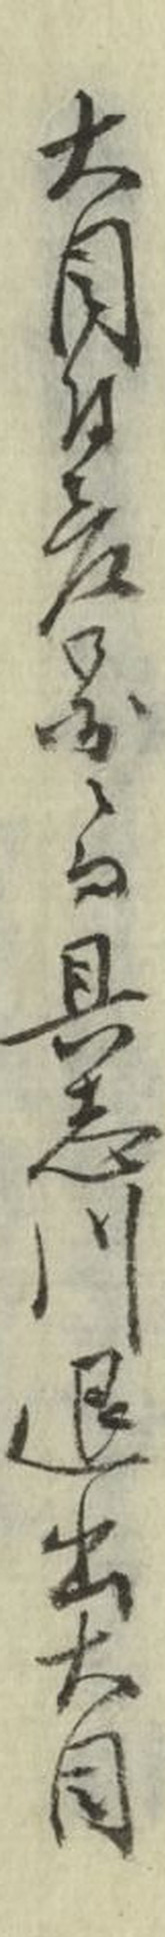大目付差図に而具志川退出大目
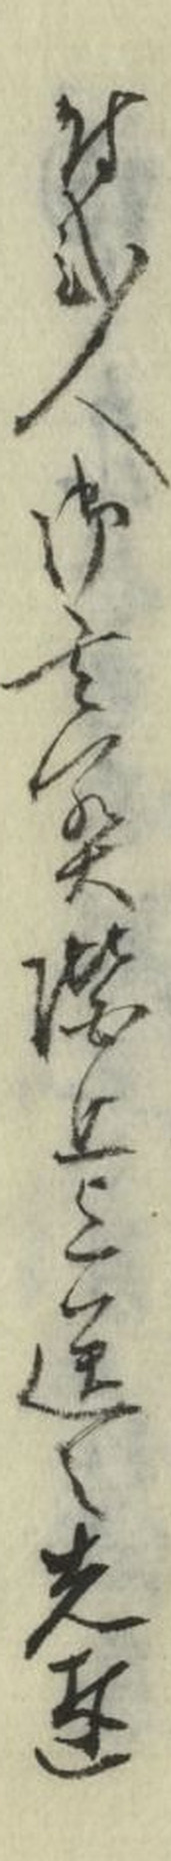付弐人御玄関階上迄送之先達
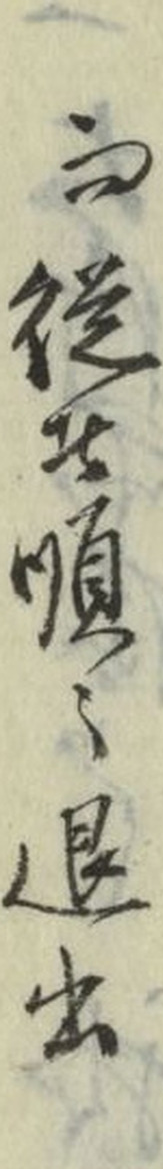而従者順々退出
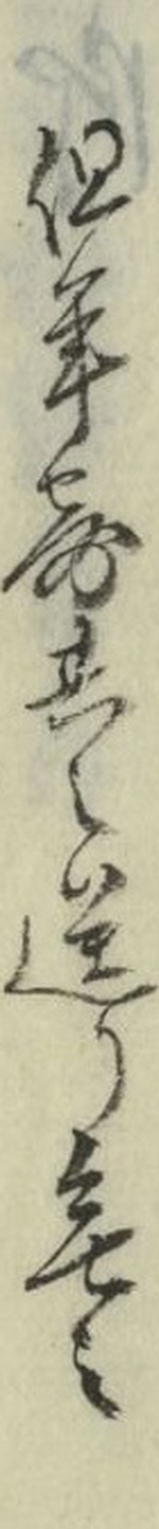但年寄共之送り無之
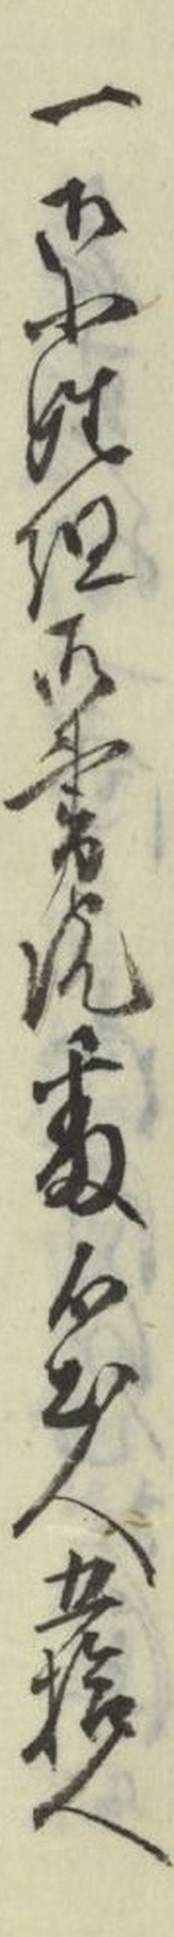一御小姓組御書院番ゟ出人五拾人
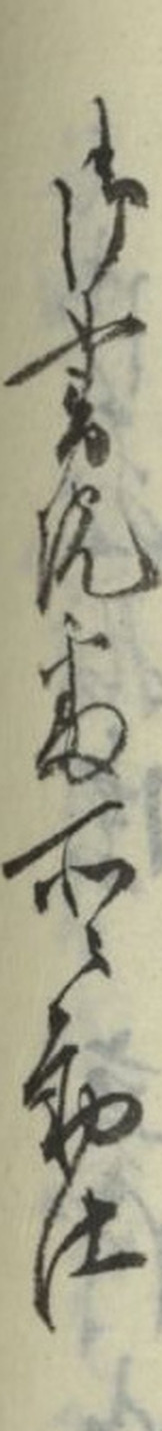御書院番所々勤仕
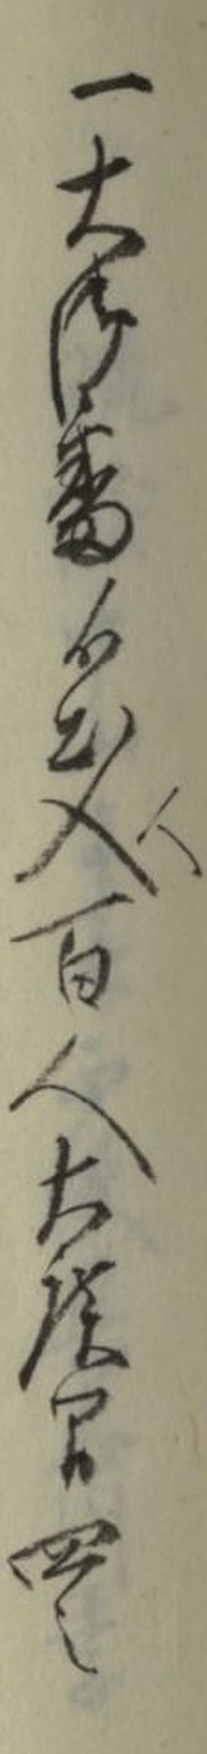一大御番ゟ出入百人大広間四之
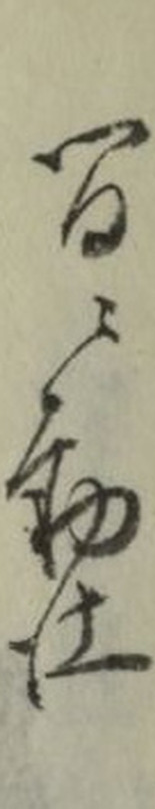間に勤仕

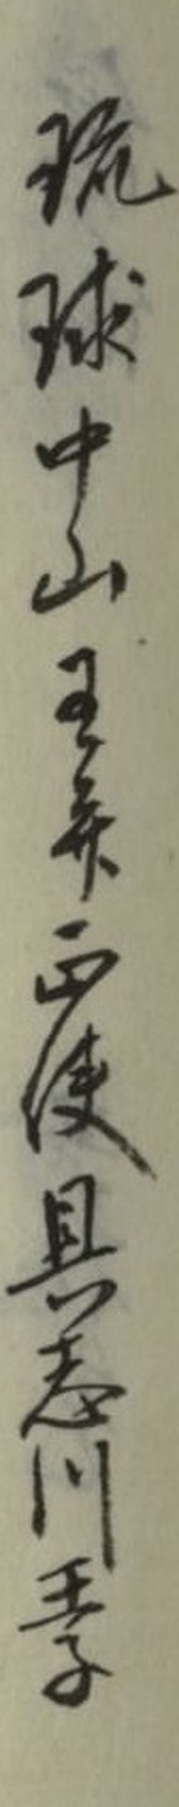琉球中山王幷正使具志川王子
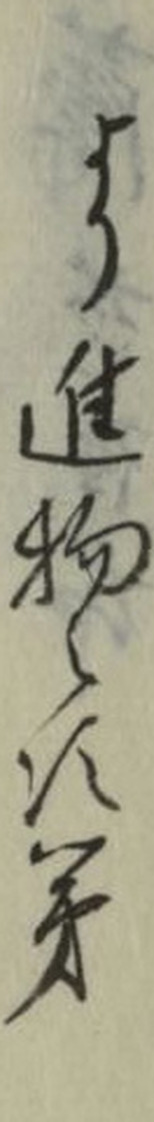より進物之次第
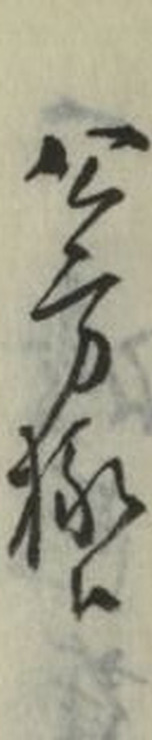公方様え
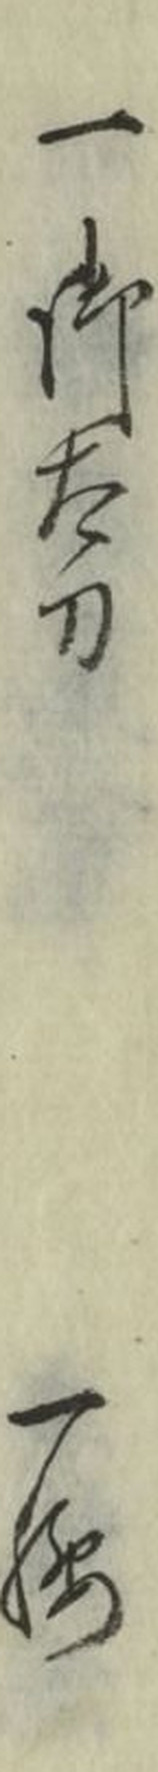一御太刀一腰
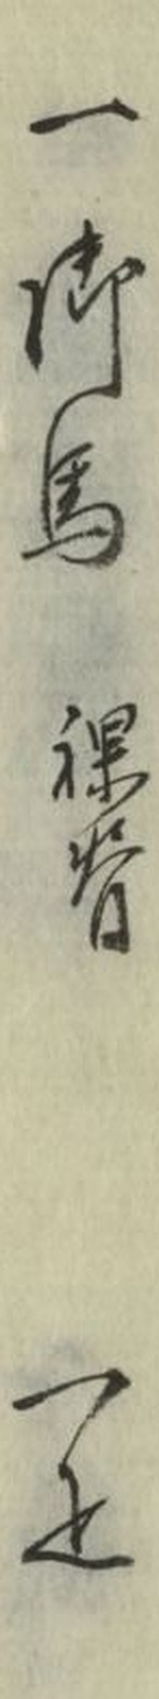一御馬裸背一疋
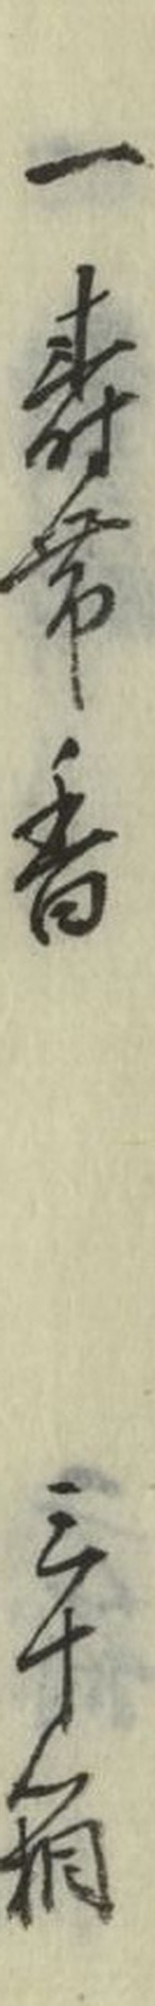一寿帯香三十箱

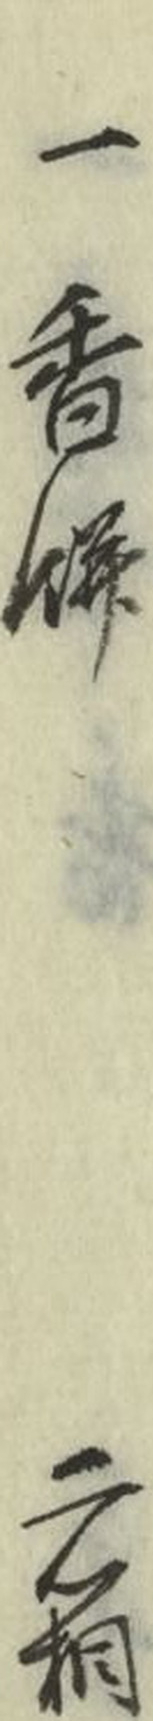一香餅二箱
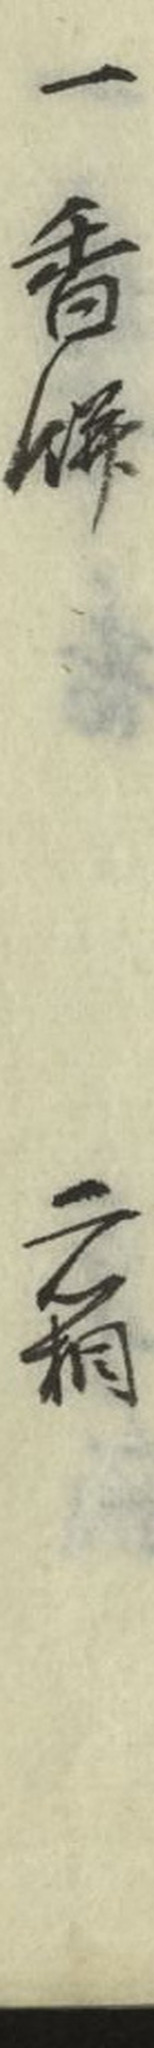一香餅二箱
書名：琉球人来朝記 三
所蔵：University of the Ryukyus Library
